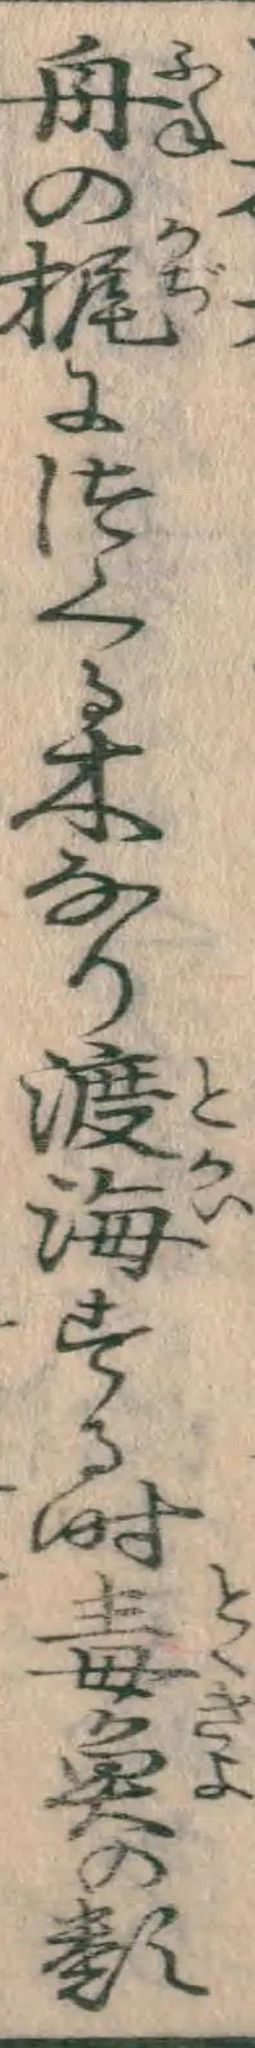舟の梶につくる木なり渡海する時毒魚の類
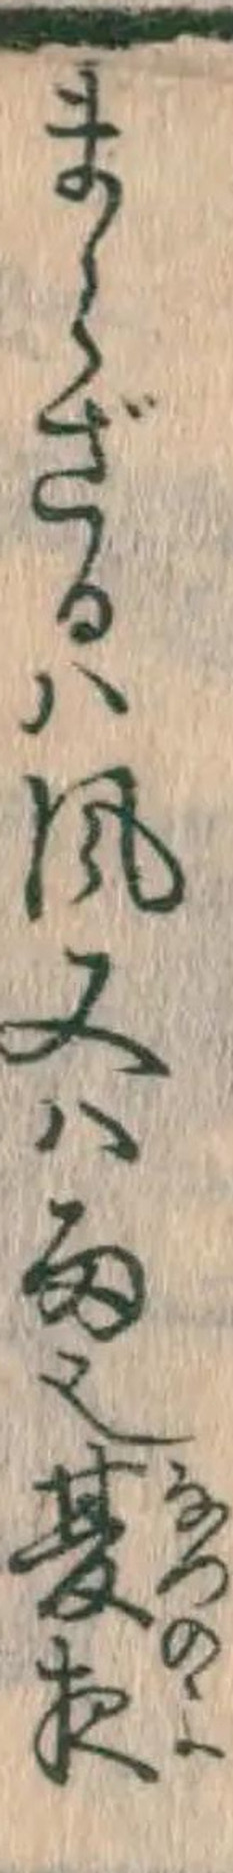まらざるは風又は雨也夏夜
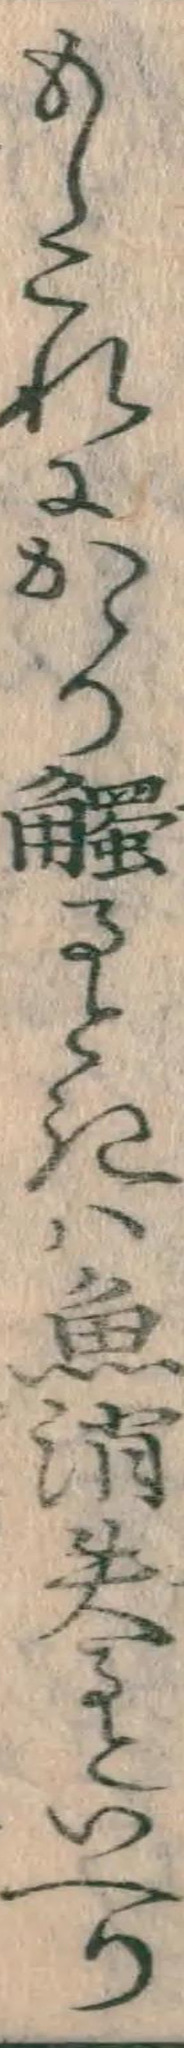もしこれにかゝり触るときは魚消失るといへり
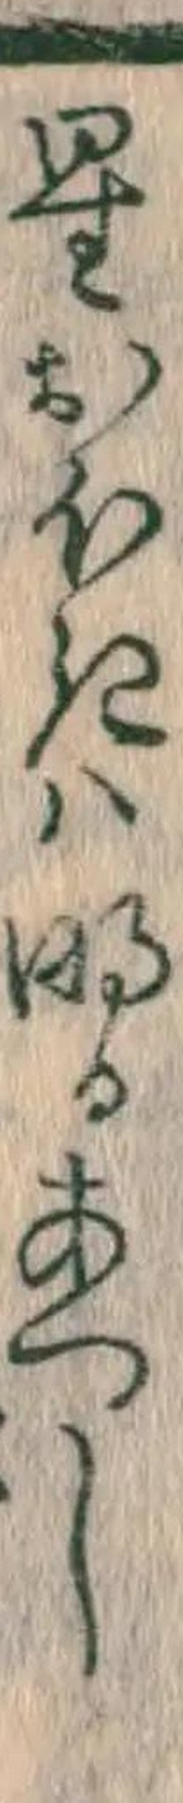星おほきは明日あつし
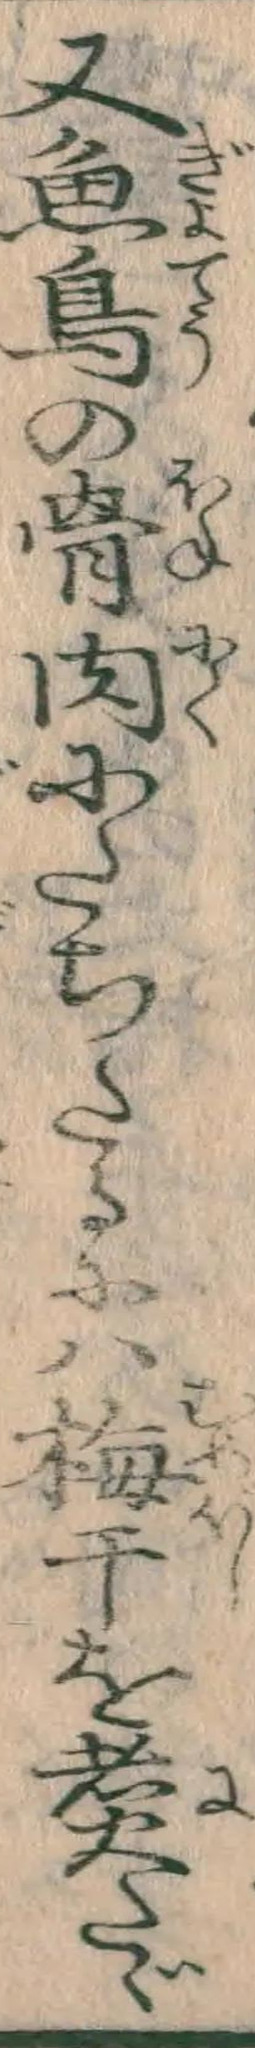又魚鳥の骨肉にたちたるには梅干を煮たゞ
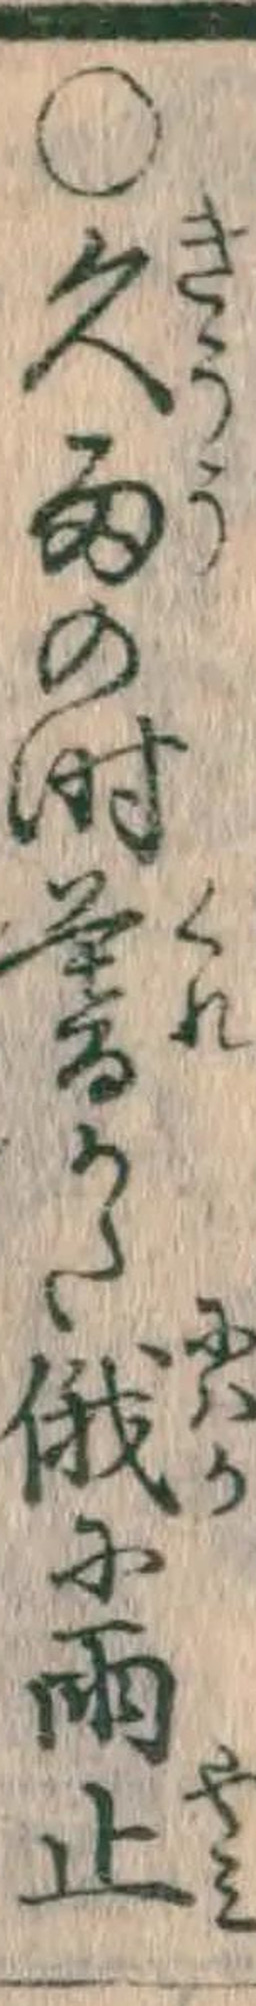○久雨の時暮かた俄に雨止
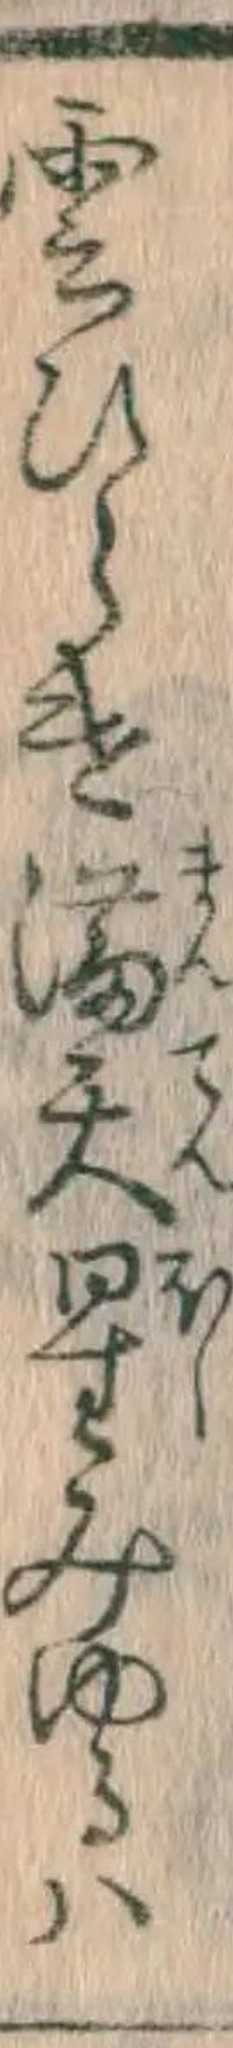雲ひらき満天星みゆるは
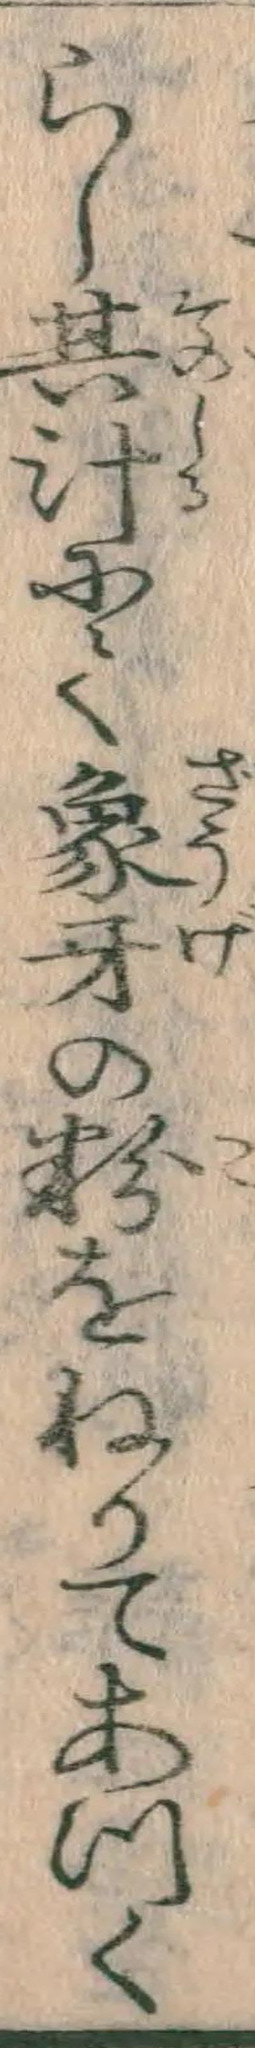らし其汁にて象牙の粉をねりてあつく
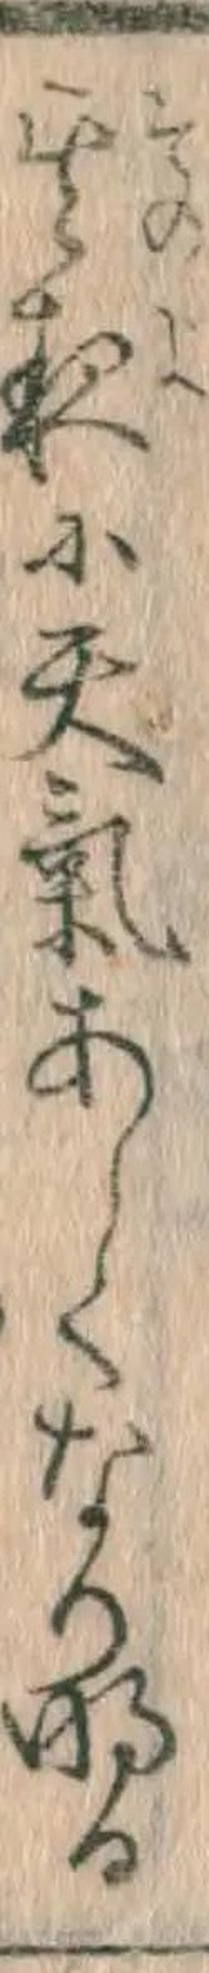其夜に天気あしくなり明日
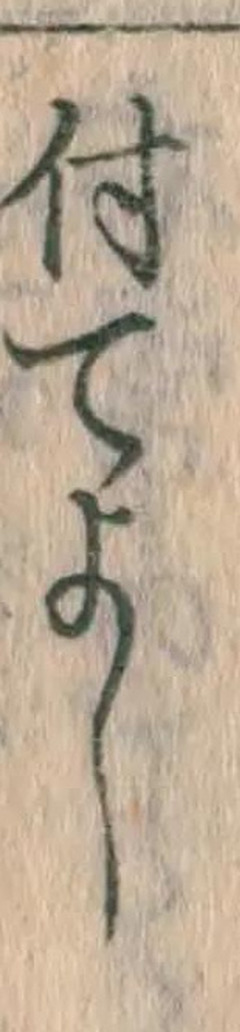付てよし
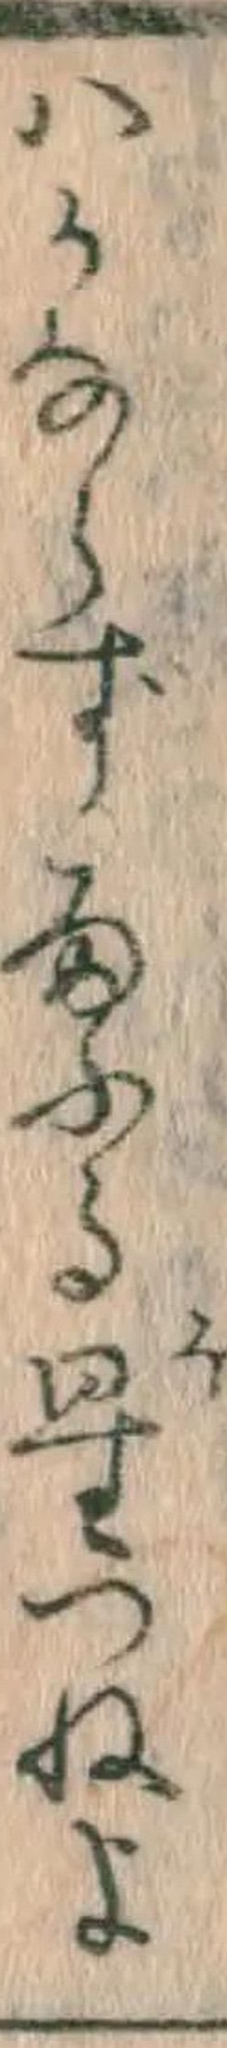はかならず雨ふる星つねよ
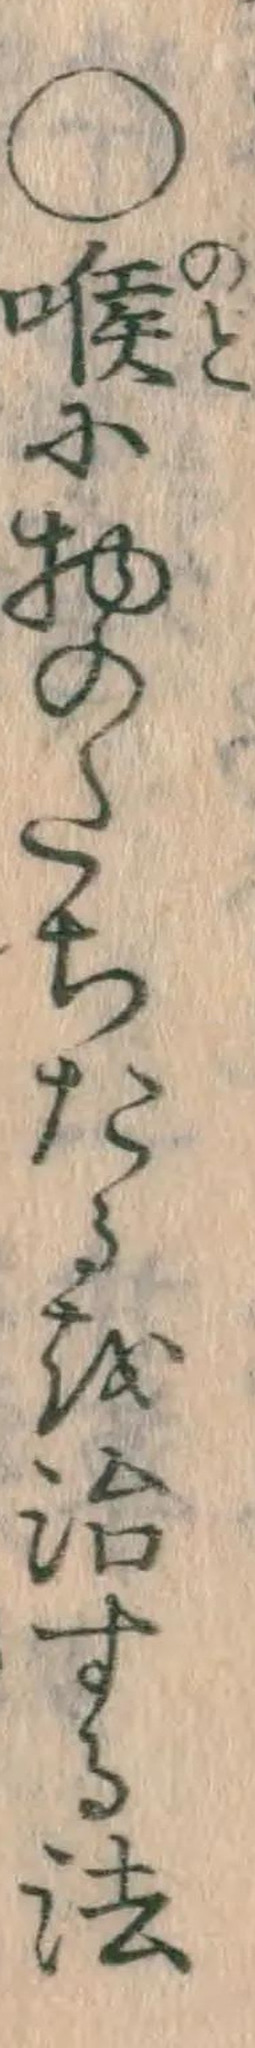○喉に物のたちたるを治する法
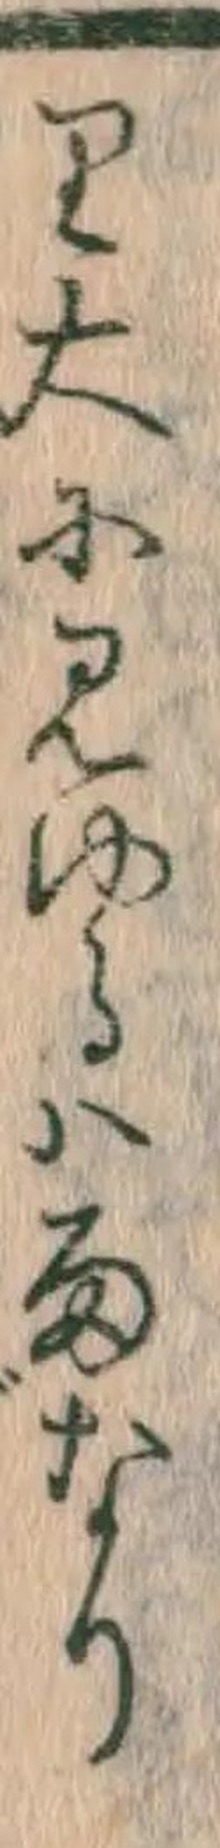り大に見ゆるは雨なり
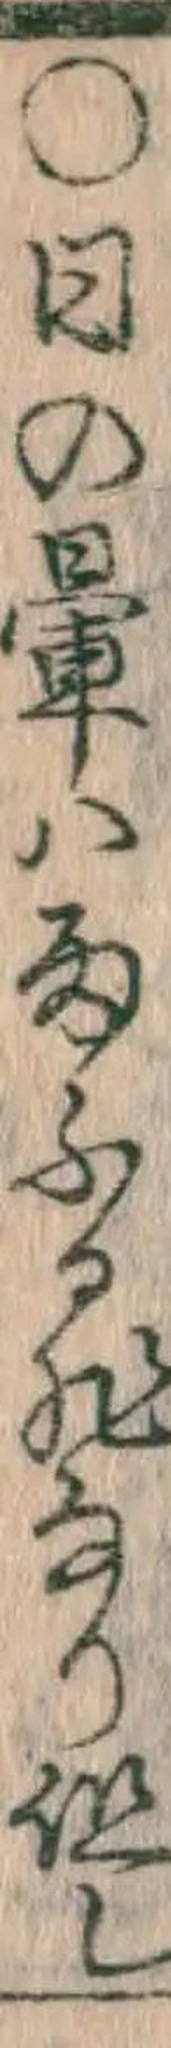○日の暈は雨ふる兆なり但し
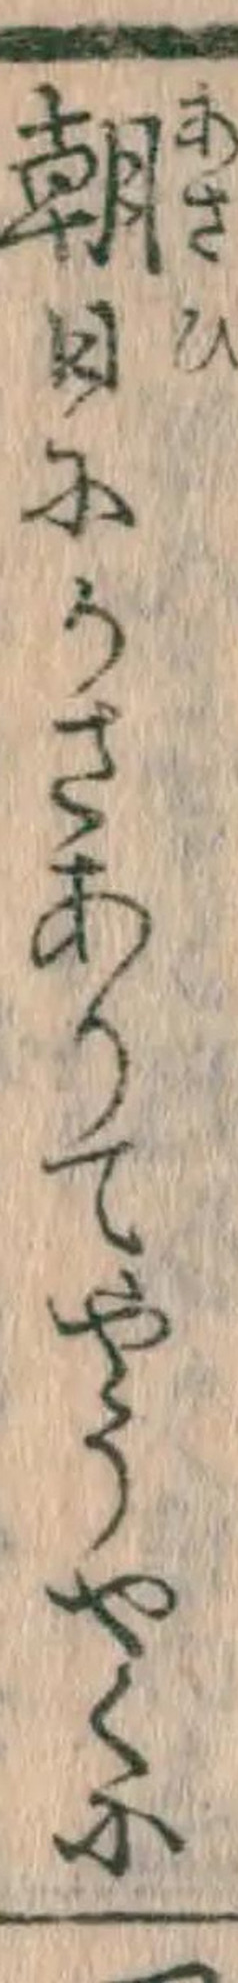朝日にかさありてやうやくに
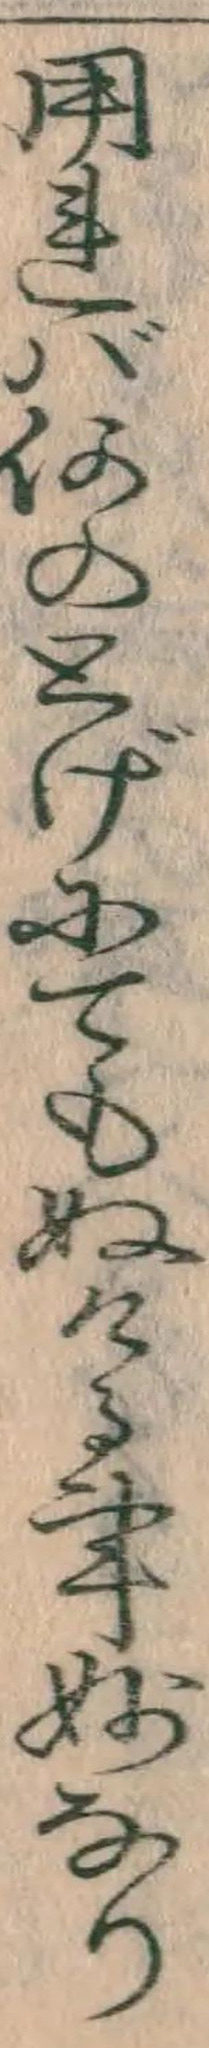用れば何のとげにてもぬける事妙なり
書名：広益秘事大全 3巻. [3]
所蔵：国立国会図書館 National Diet Library, JAPAN
